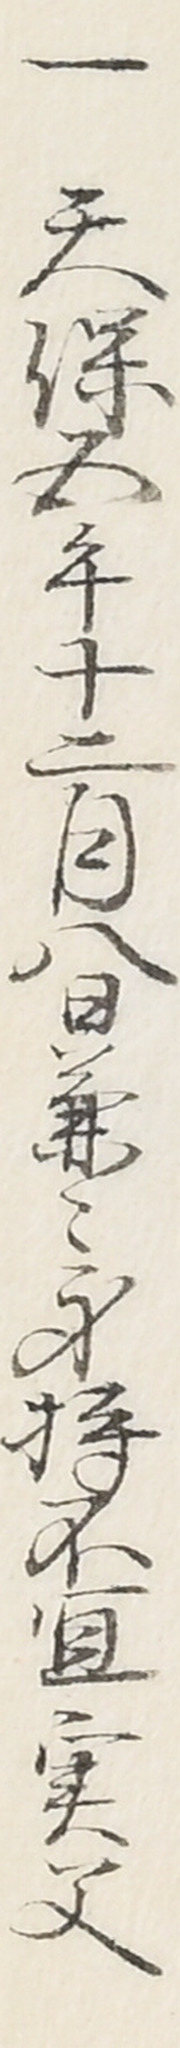一天保五午十二月八日兼々身持不宜実父
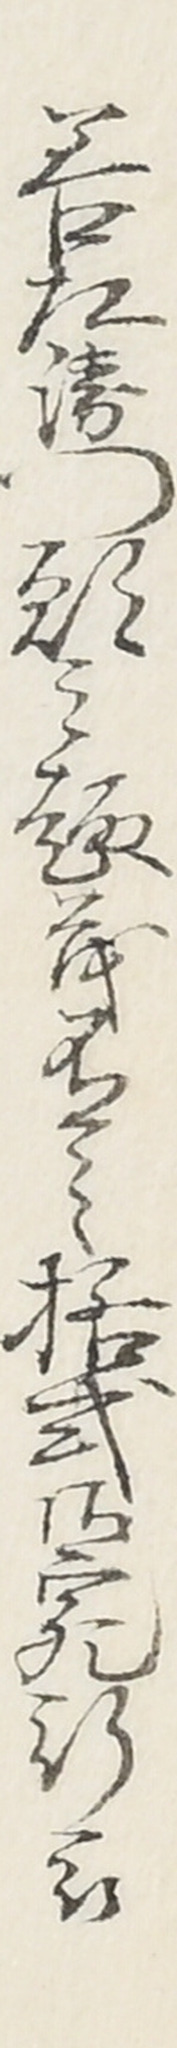善左衛門願之趣茂有之格式御宛行被
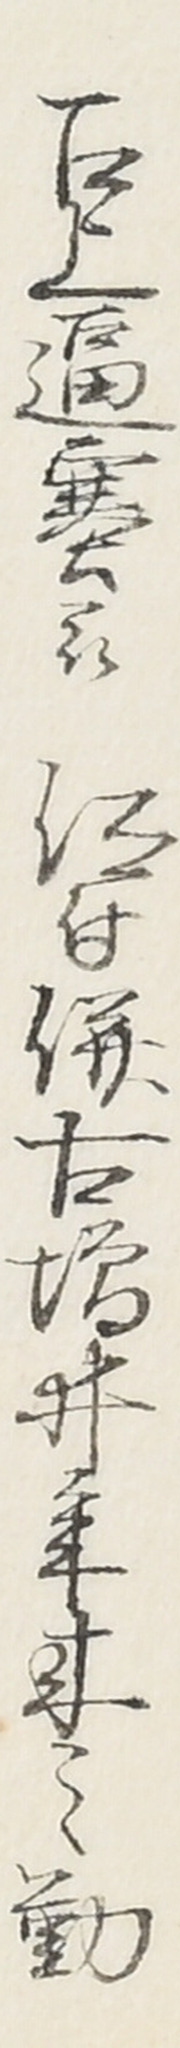召上逼塞被仰付併古増井年来之勤
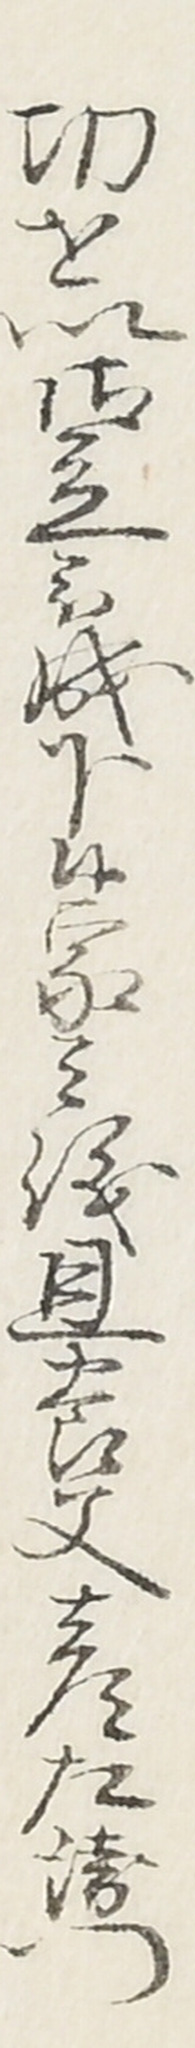功を以御立被成下候家之儀且養父彦左衛門
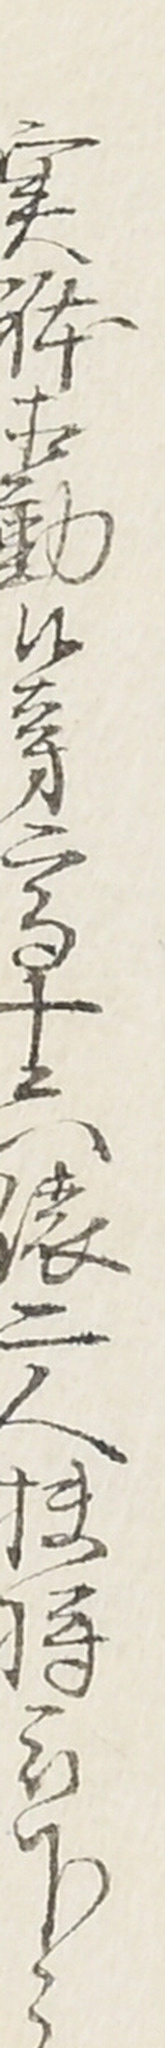実躰相勤候旁高十六俵二人扶持被下之
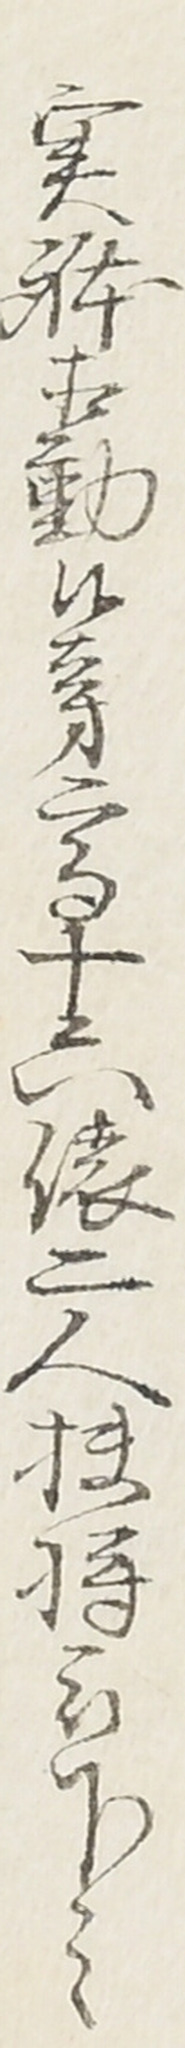実躰相勤候旁高十六俵二人扶持被下之
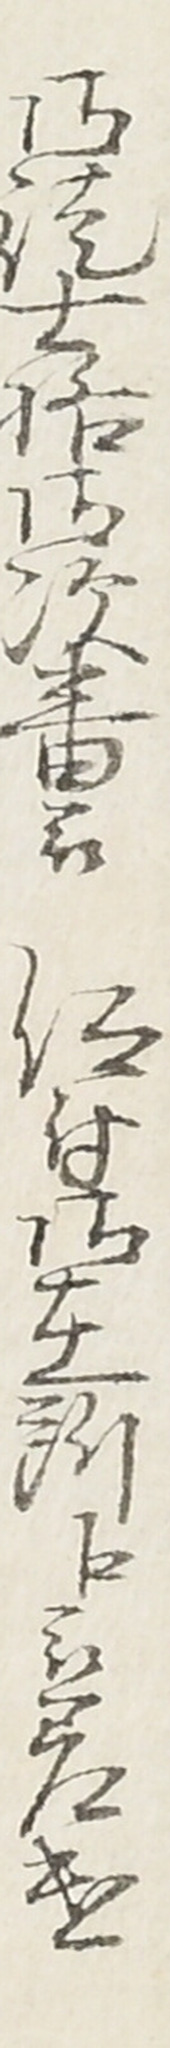御徒士格御次番被仰付御在所江被差遣
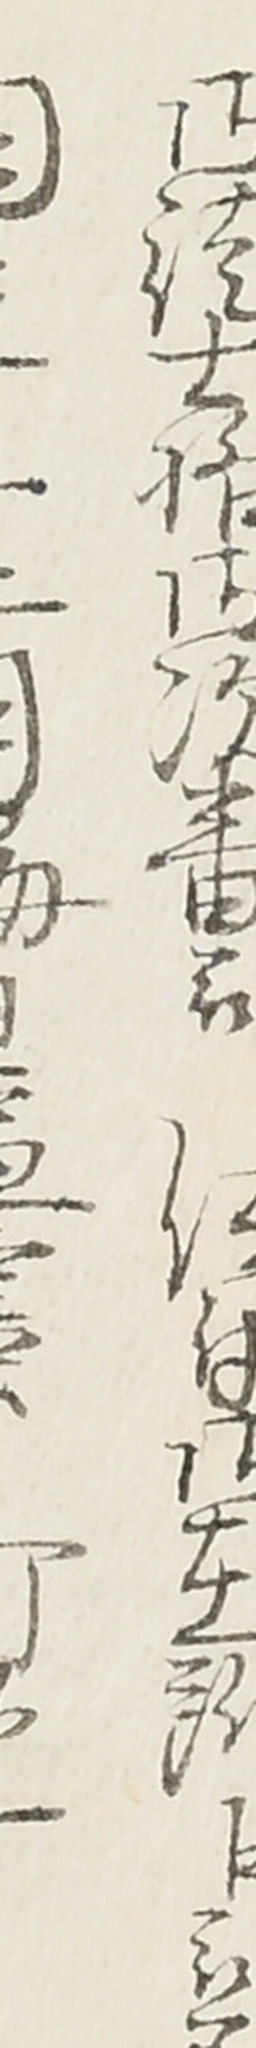一同年十二月晦日逼塞御免
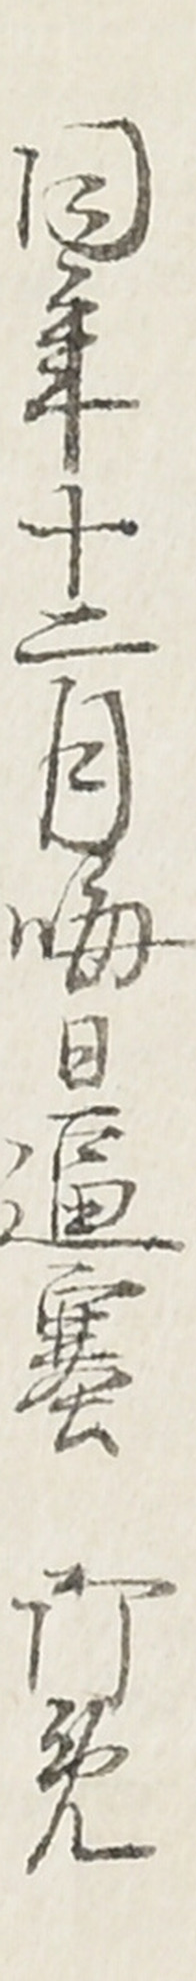一同年十二月晦日逼塞御免
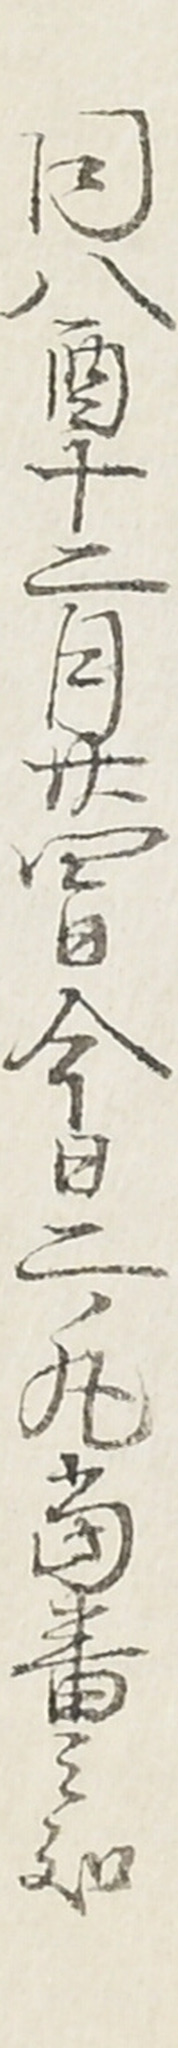一同八寅十二月廿四日今日二ノ丸当番之処
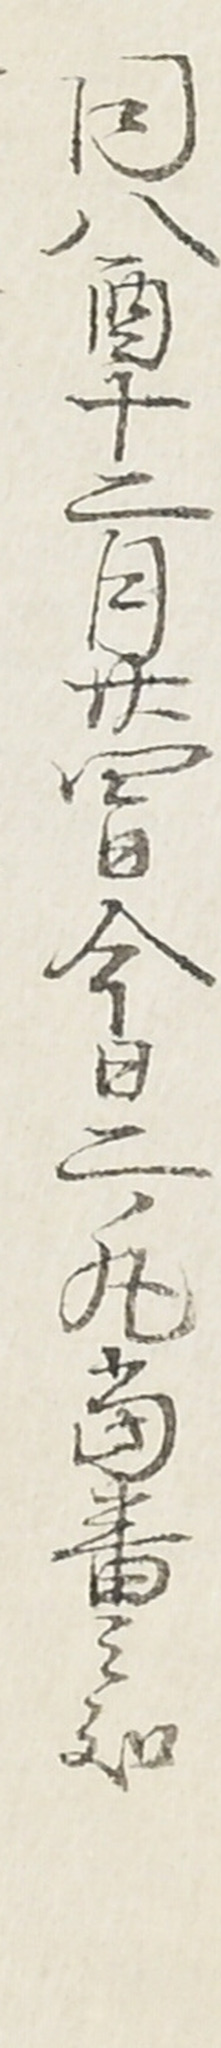一同八寅十二月廿四日今日二ノ丸当番之処
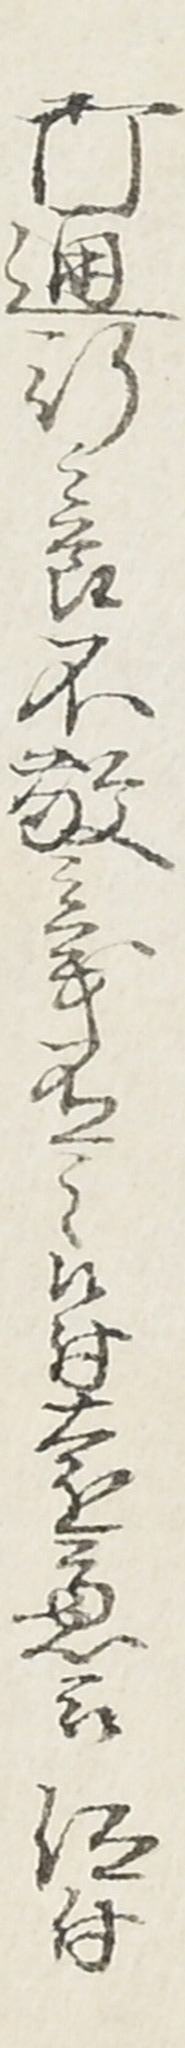御通行之節不敬之義有之候付遠慮被仰付
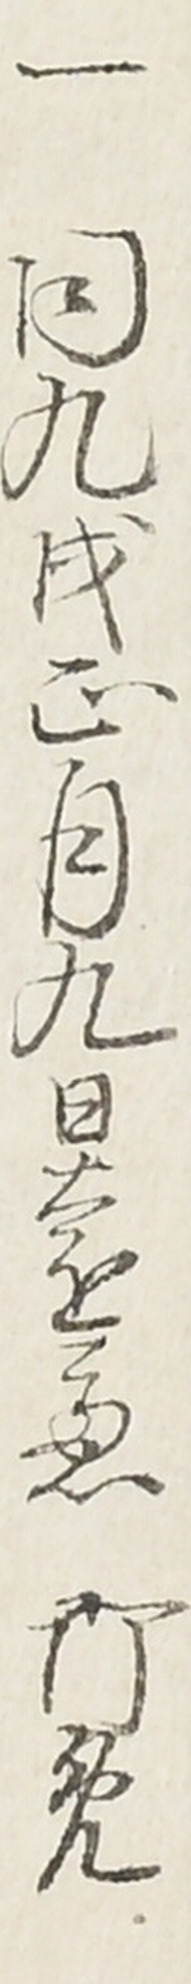一同九戌正月九日遠慮御免
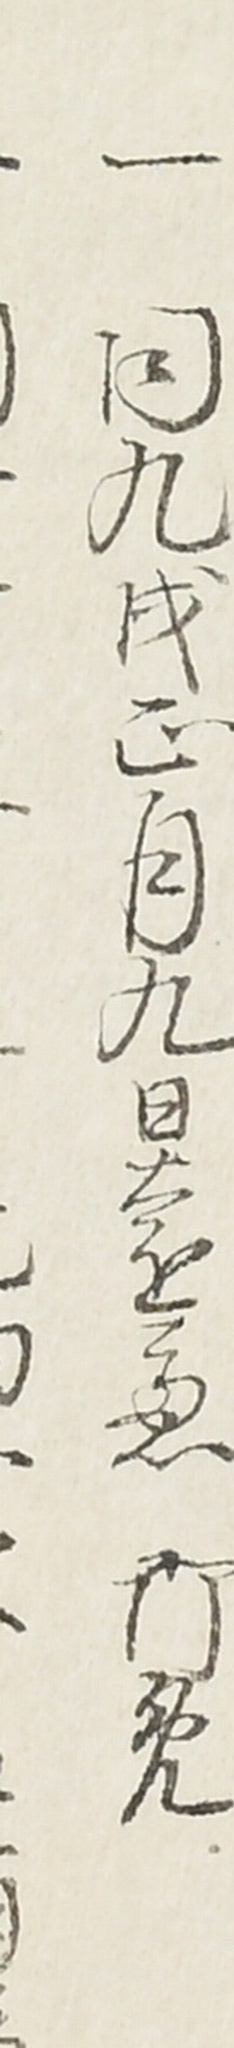一同九戌正月九日遠慮御免
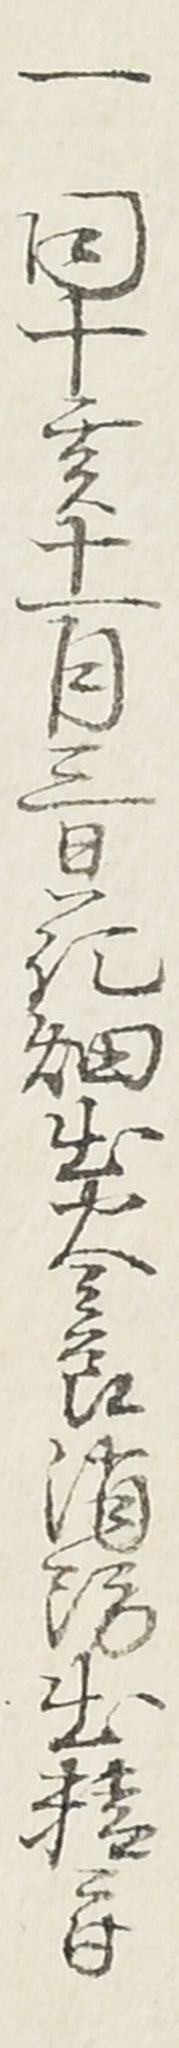一同十亥十一月三日花畑出火之節消防出精ニ付
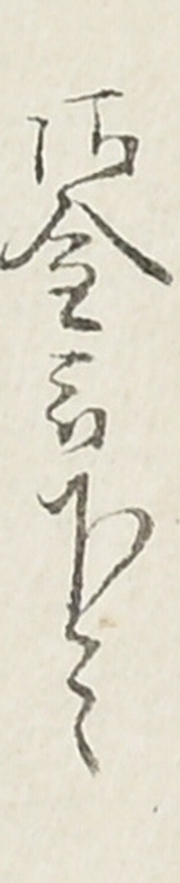御金被下之
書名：無足諸士勤仕録（四）
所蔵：伊那市立高遠町図書館・合同会社AMANE
